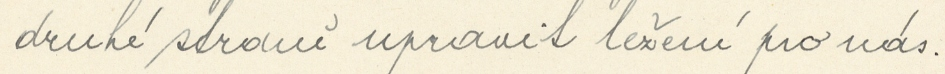druhé straně upravit ležení pro nás.
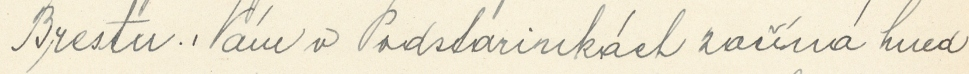Brestu. Nám v Podstarinkách začíná hned
